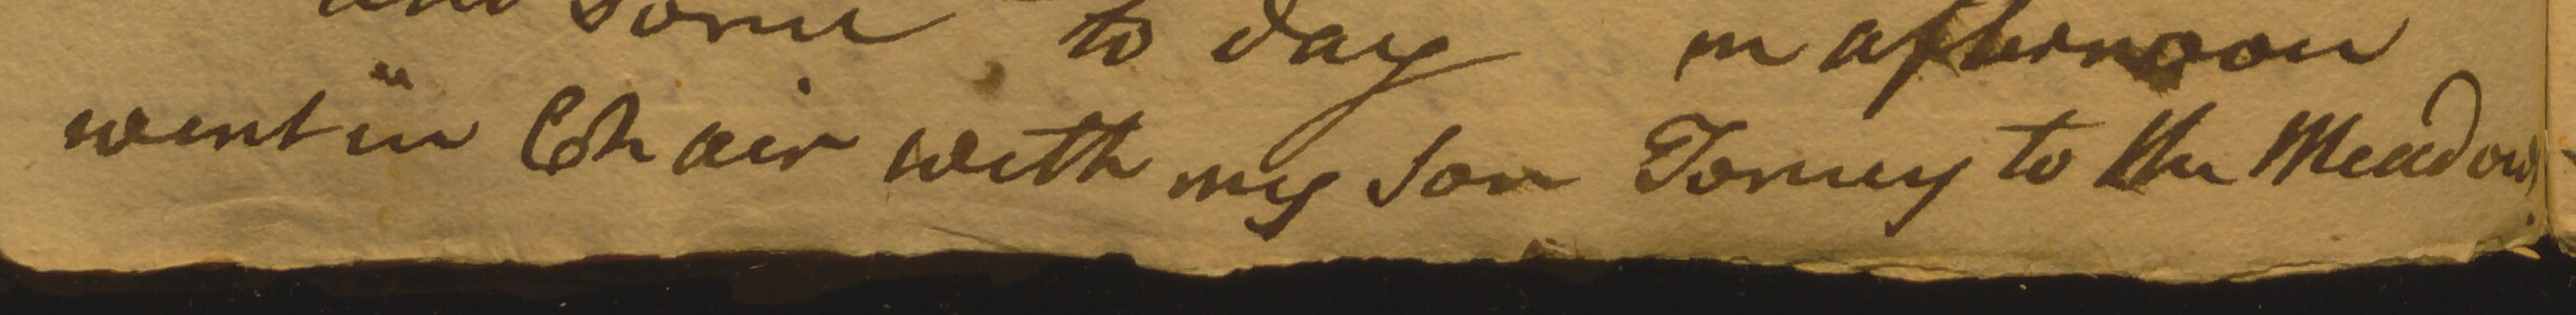went in Ch air with my Son Tomey to the Meadow
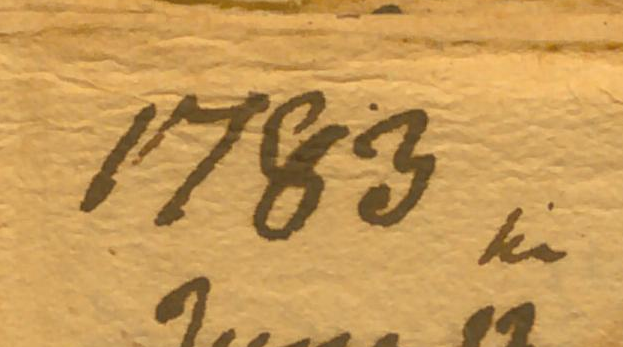1783
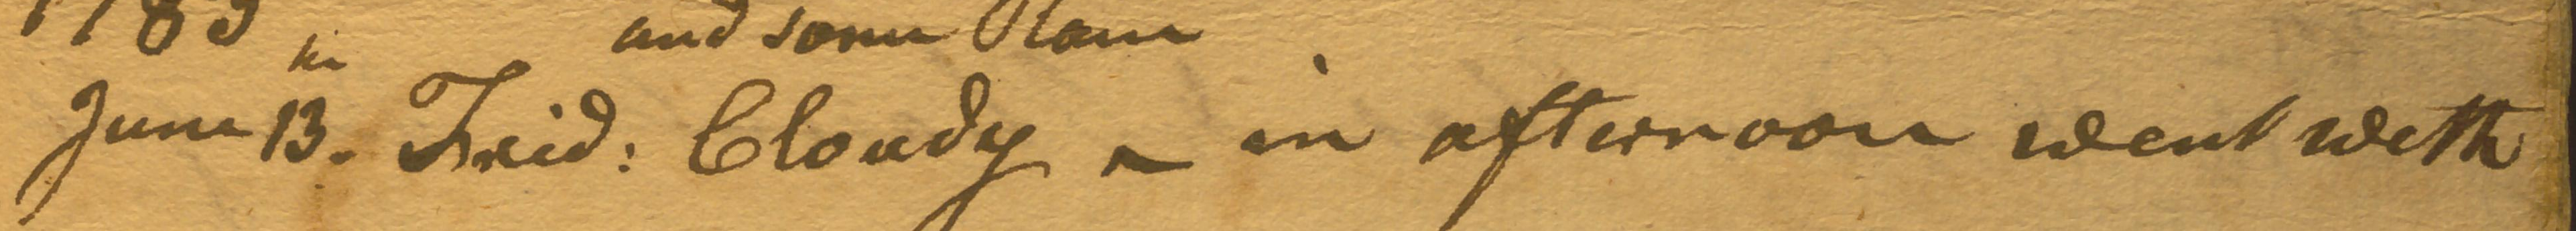June 13. Frid. Cloudy- in afternoon went with
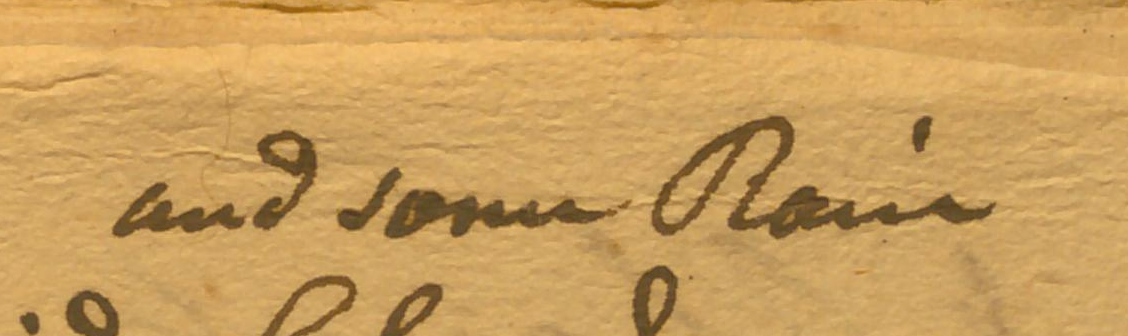and some Rain
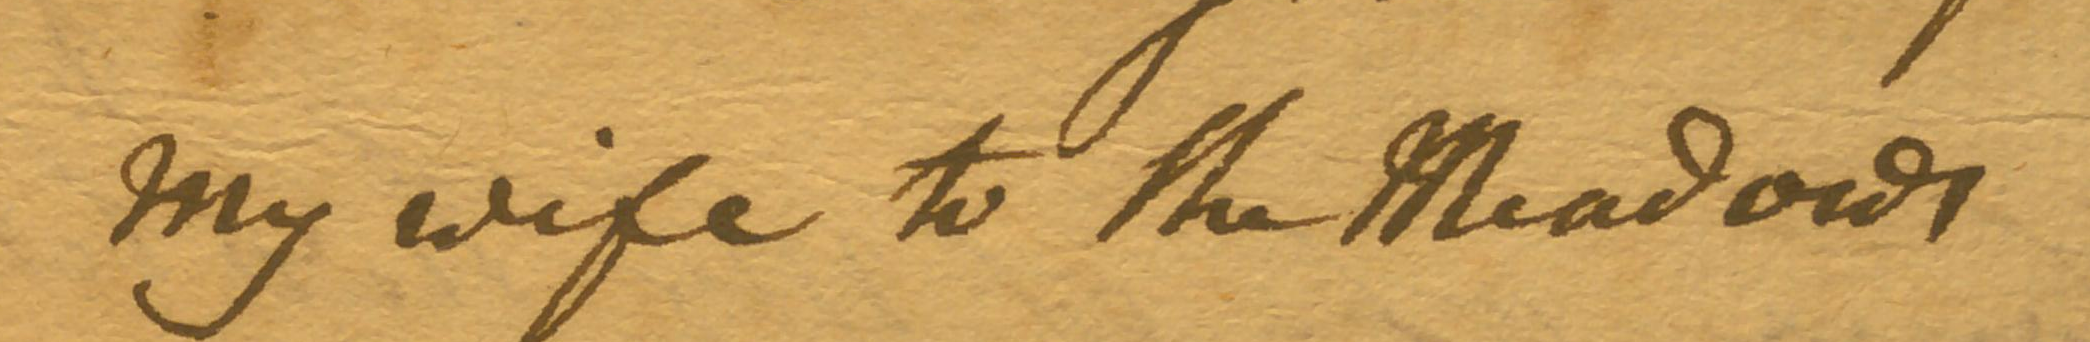my wife to the Meadows
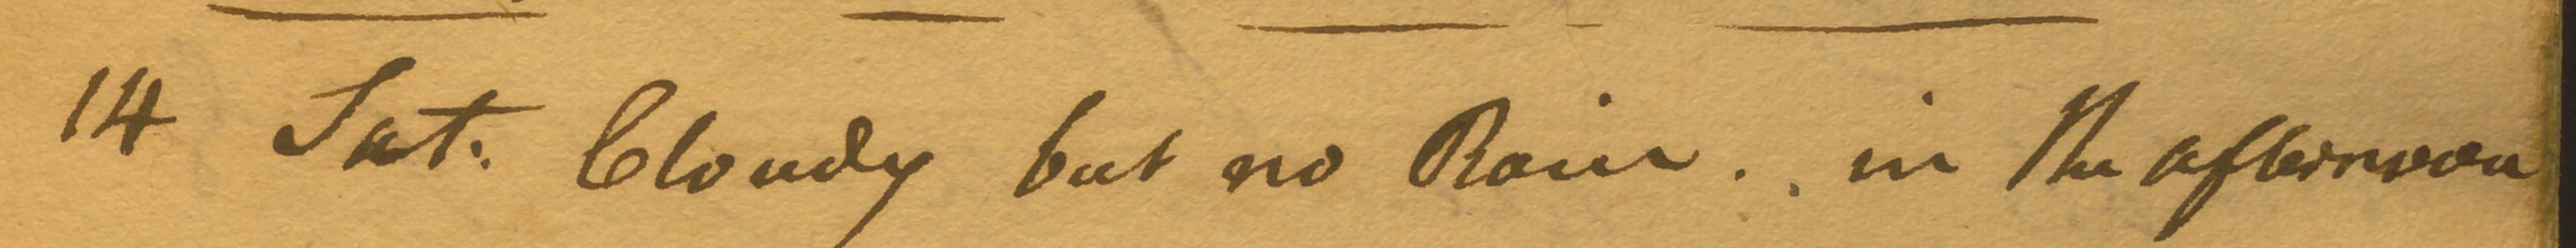14 Sat. Cloudy but no Rain. in the afternoon
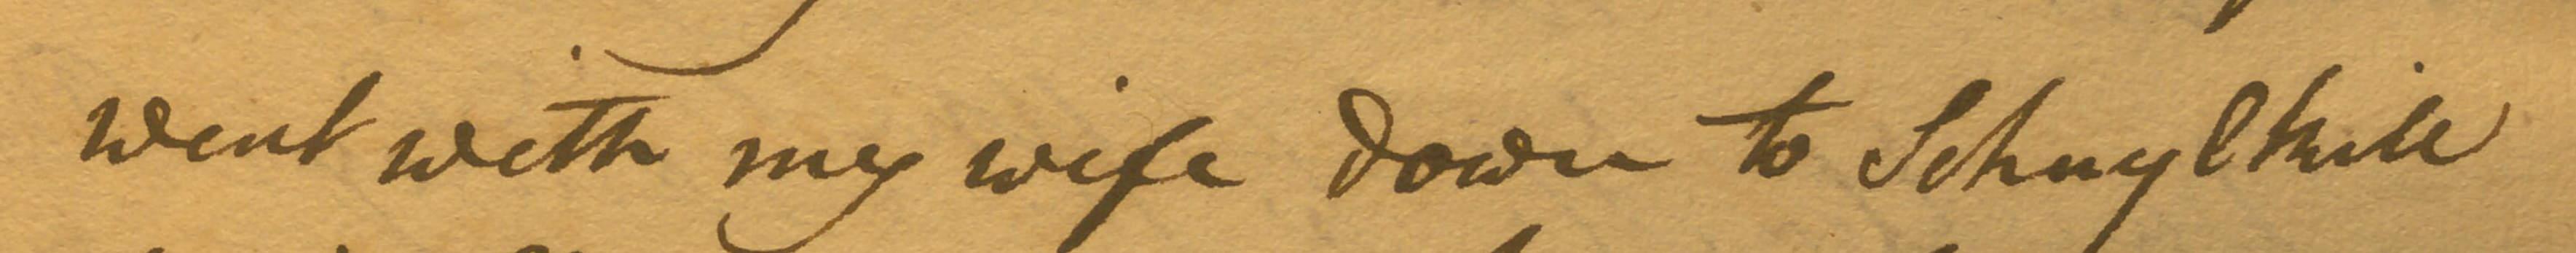went with my wife down to Schuylkill
